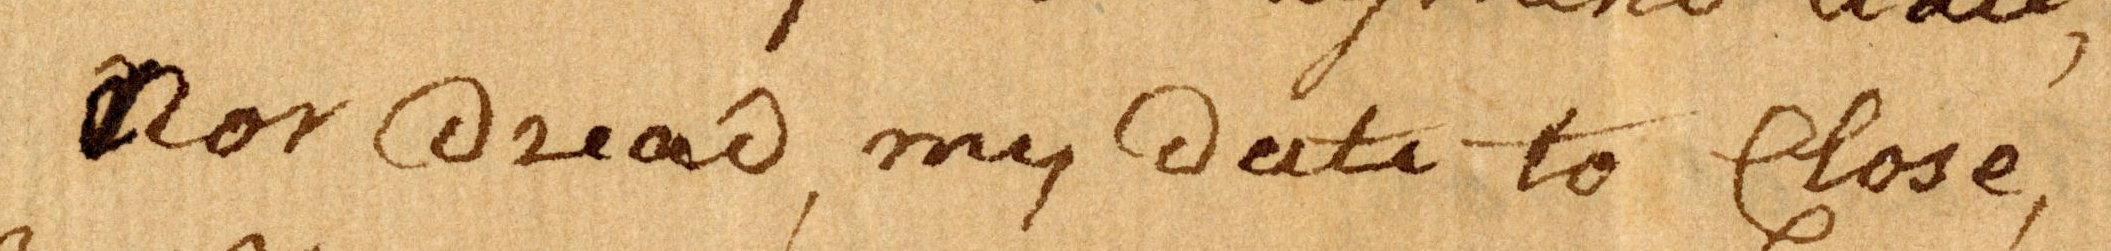Nor dread, my date to Close,
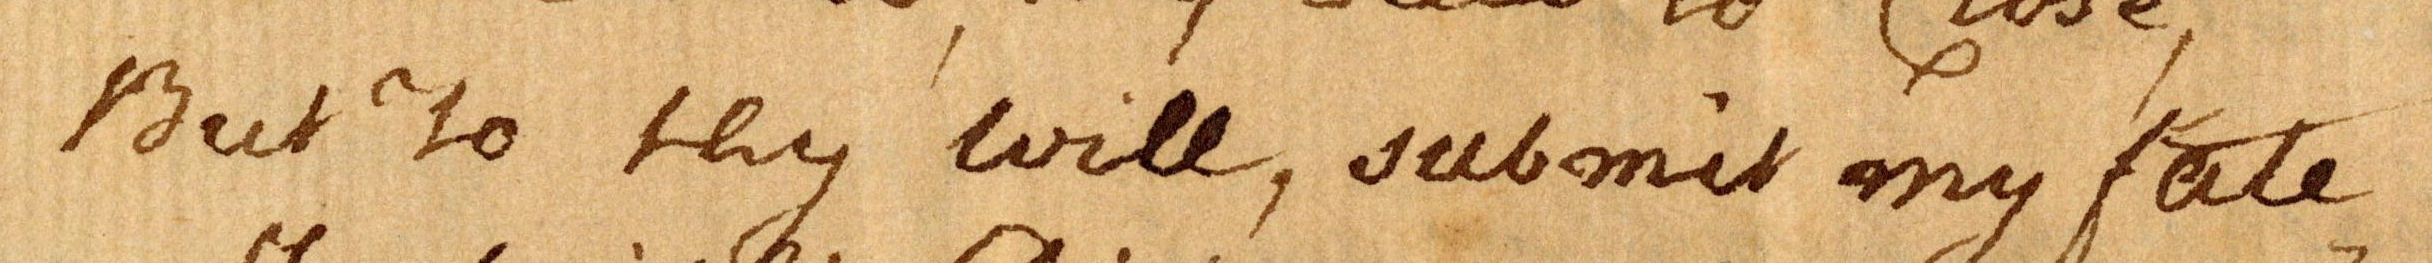But To thy will, submit my fate,
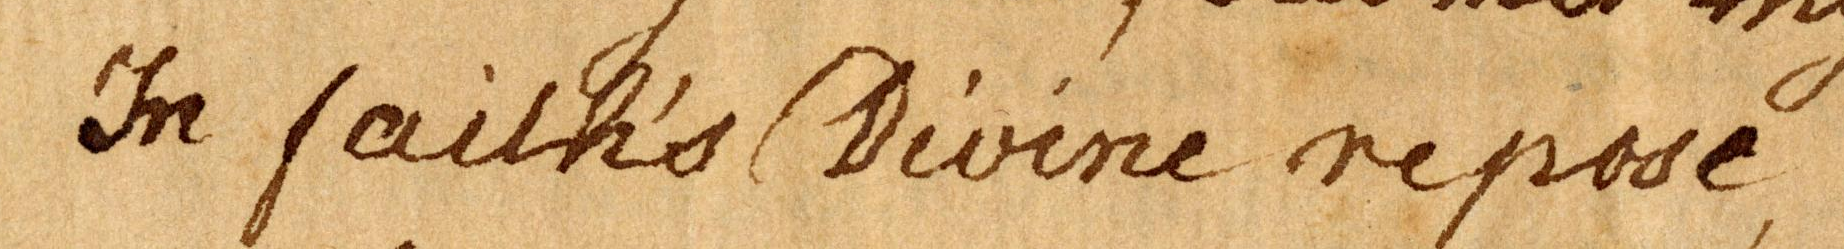In faithful Divine repose,
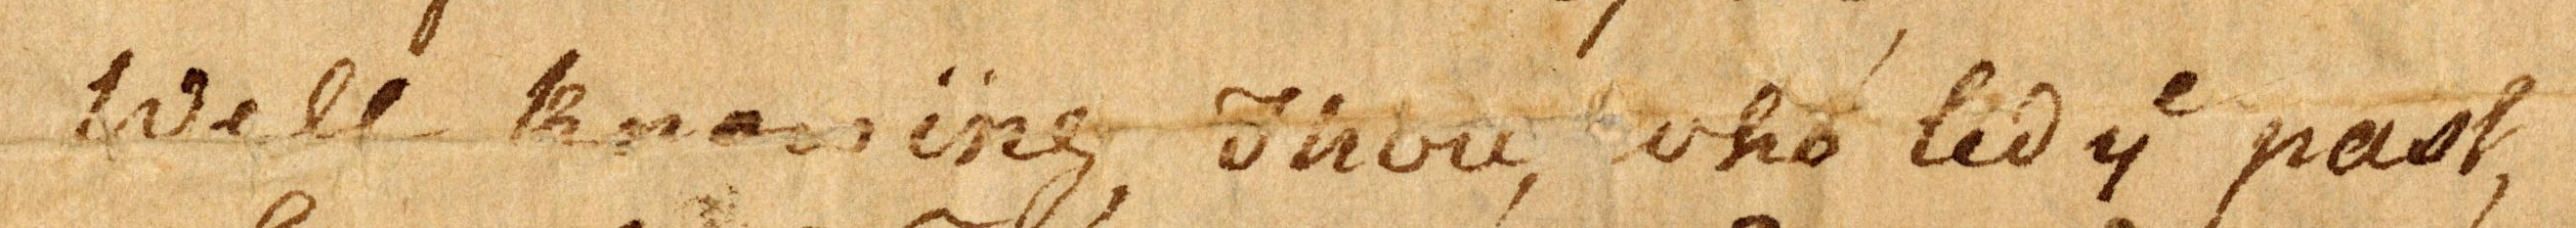Well knowing, Thou, who led y^e past,
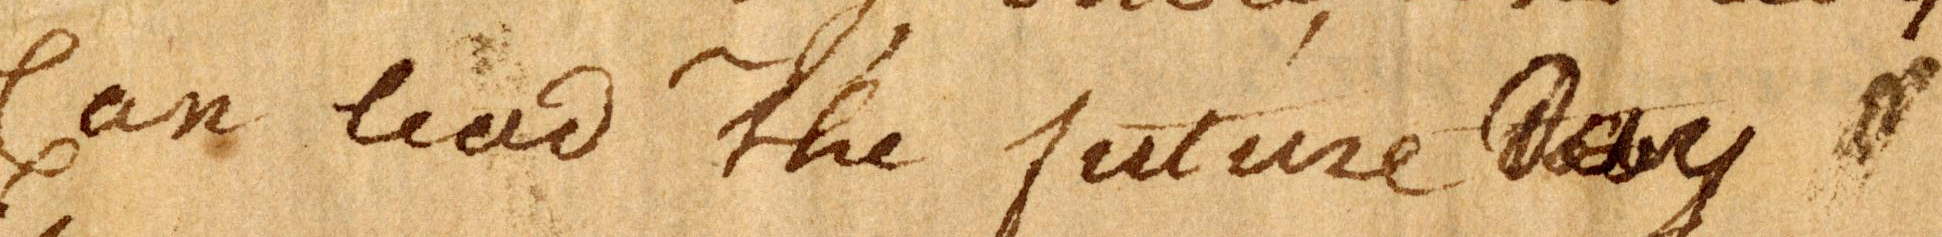Can lead the future Day,
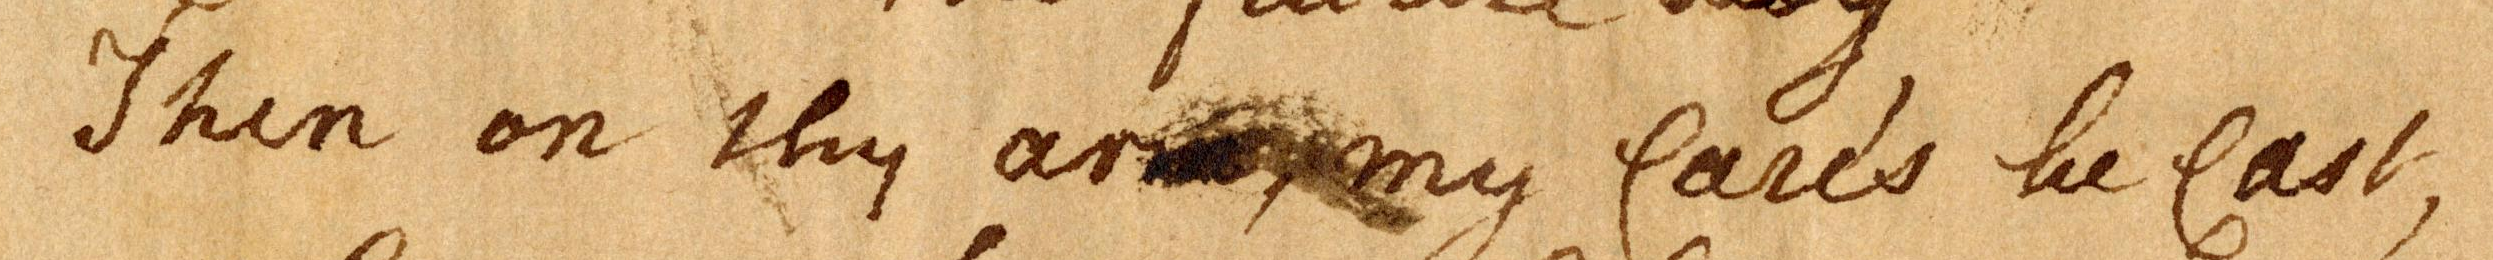Then on thy arm my Cards [be] Cast,
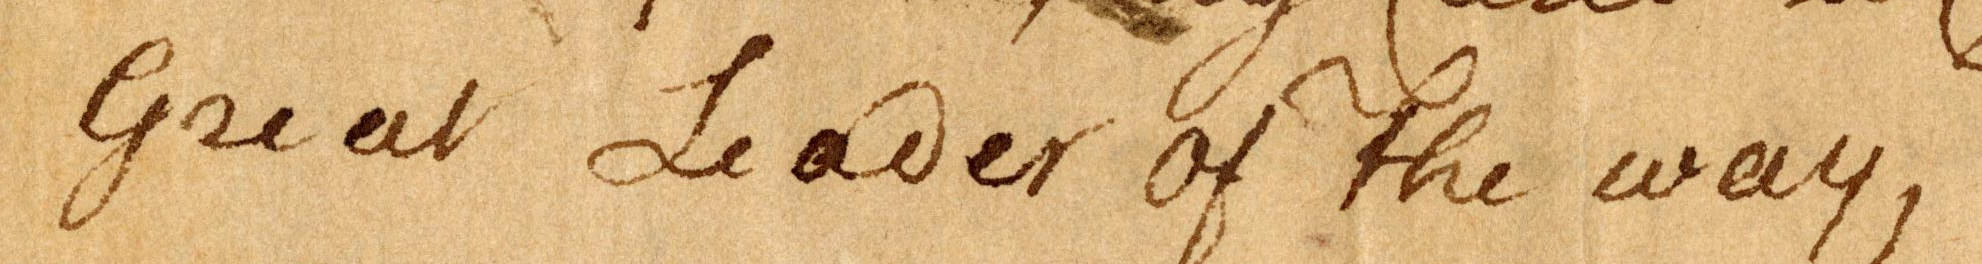Great Leader of the way,
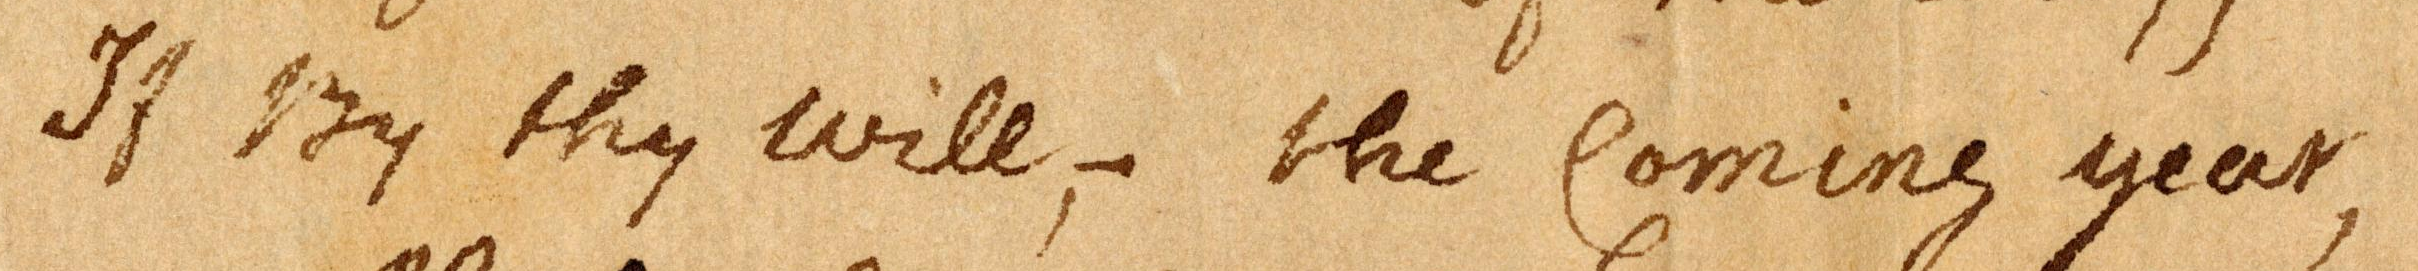If By thy will- the Coming year,
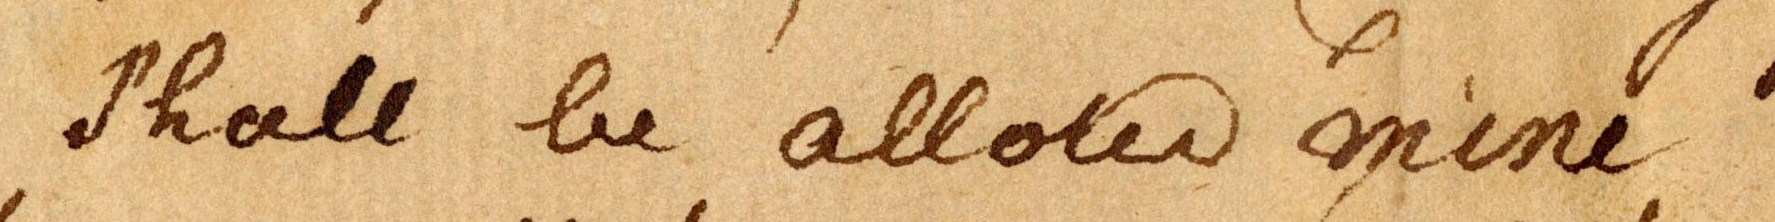Shall be alloted mine,
